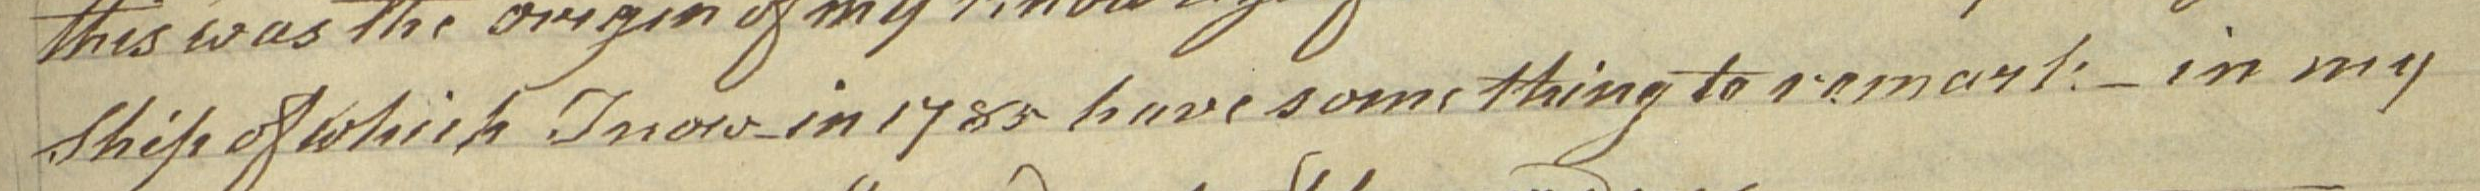Ship of which I now in 1785 have some thing to remark in my
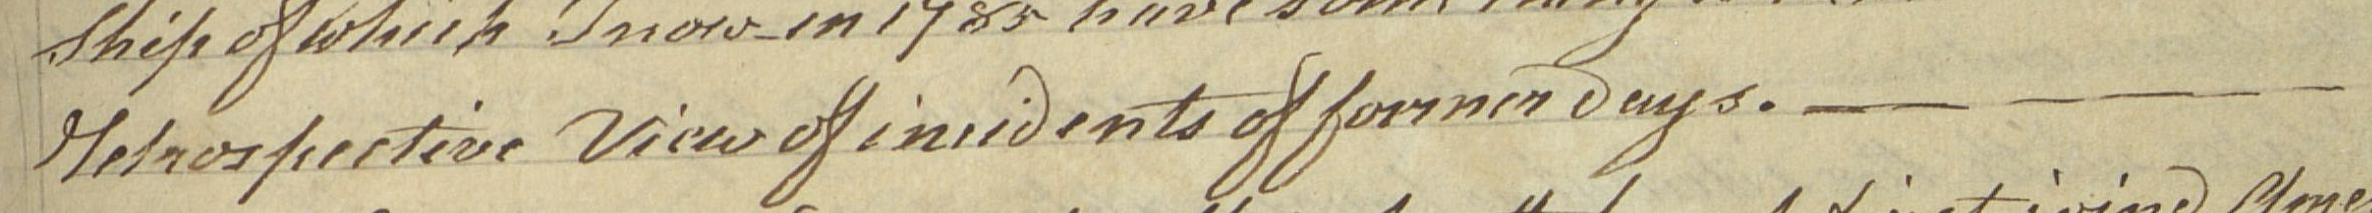Retrospective View of incidents of former days.
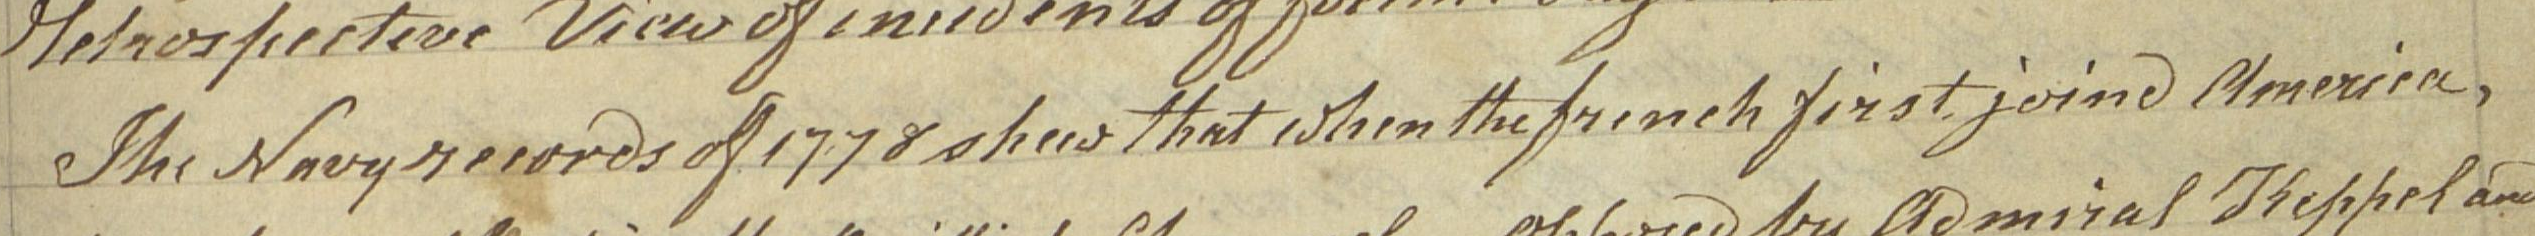The Navy records of 1778 show that when the french first joind America,
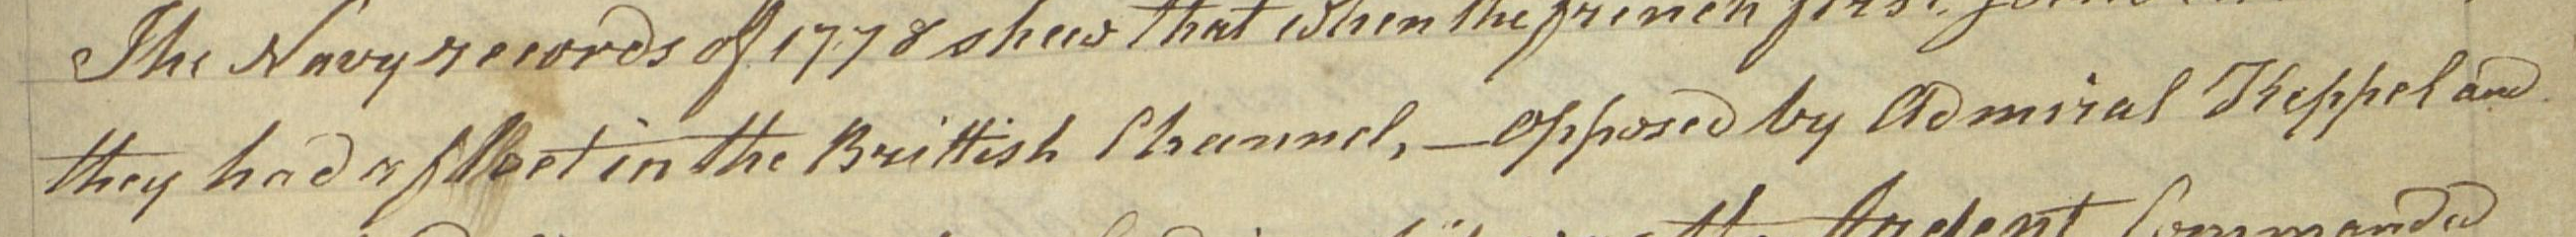they had fleet in the Brittish Channel, opposed by Admiral Keppel and
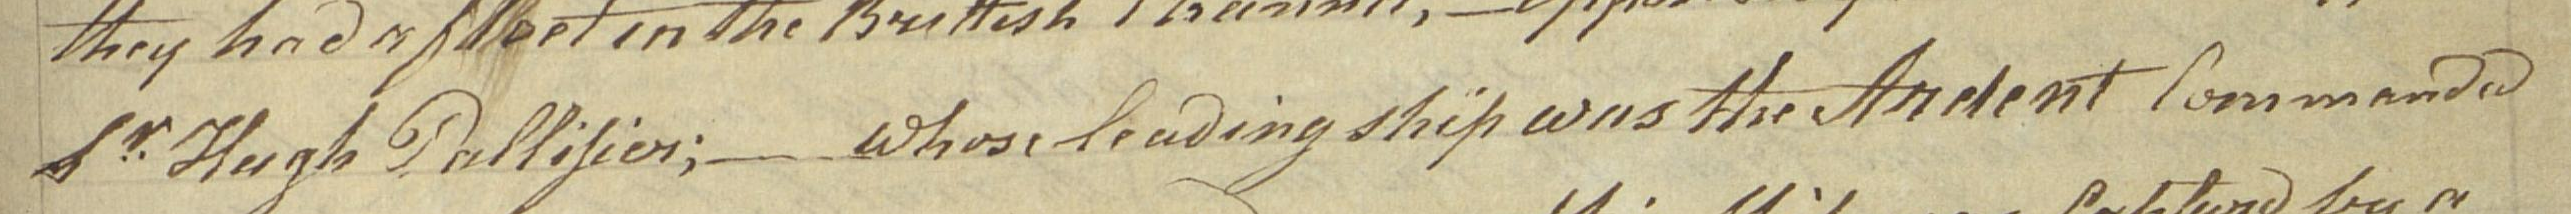S^r. Hugh Pallifier; Whose leading ship was the Ardent Commanded
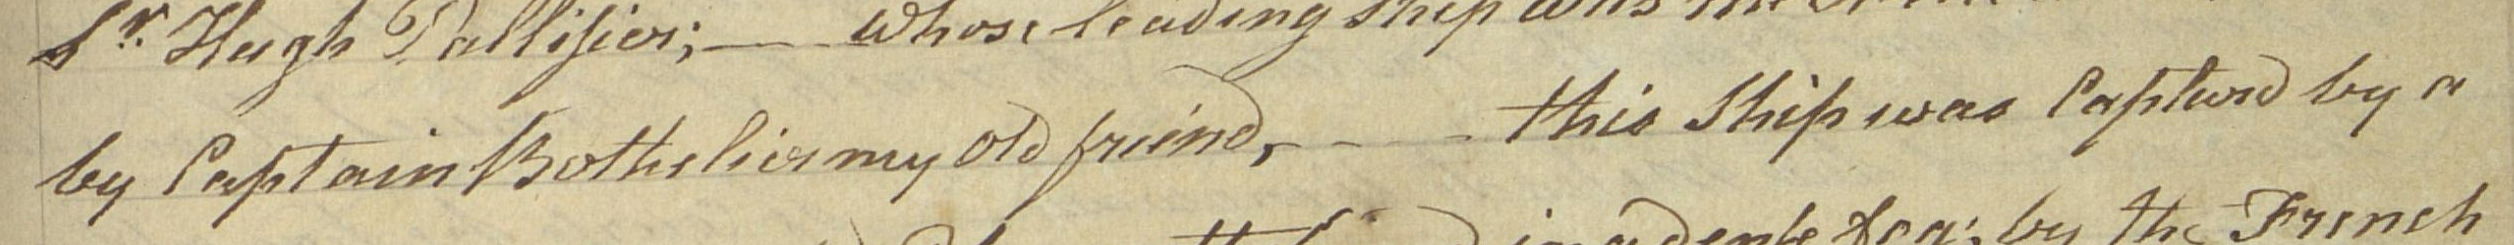by Captain Bothelier my old friend, this Ship was Capturd by a
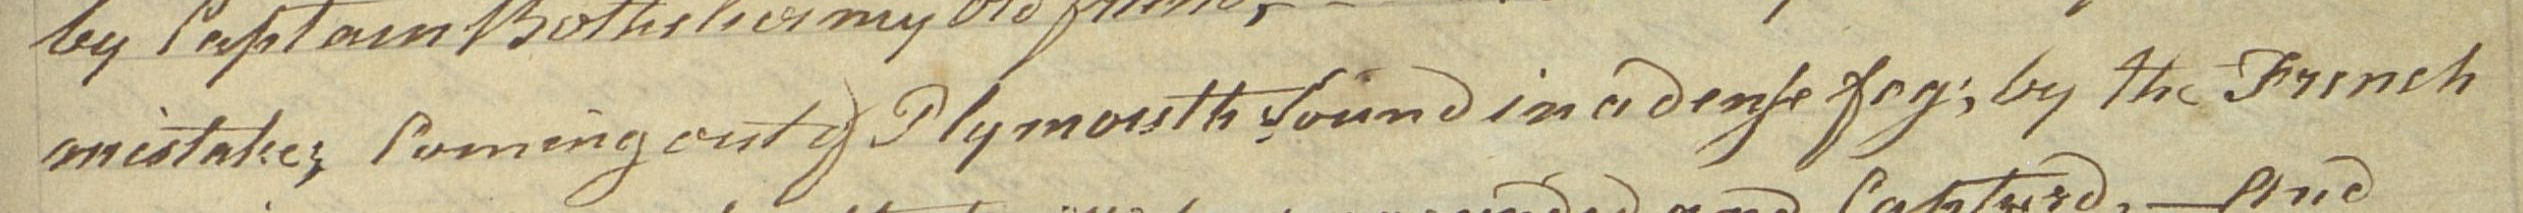mistake, Coming out of Plymouth Sound in a dense fog; by the French
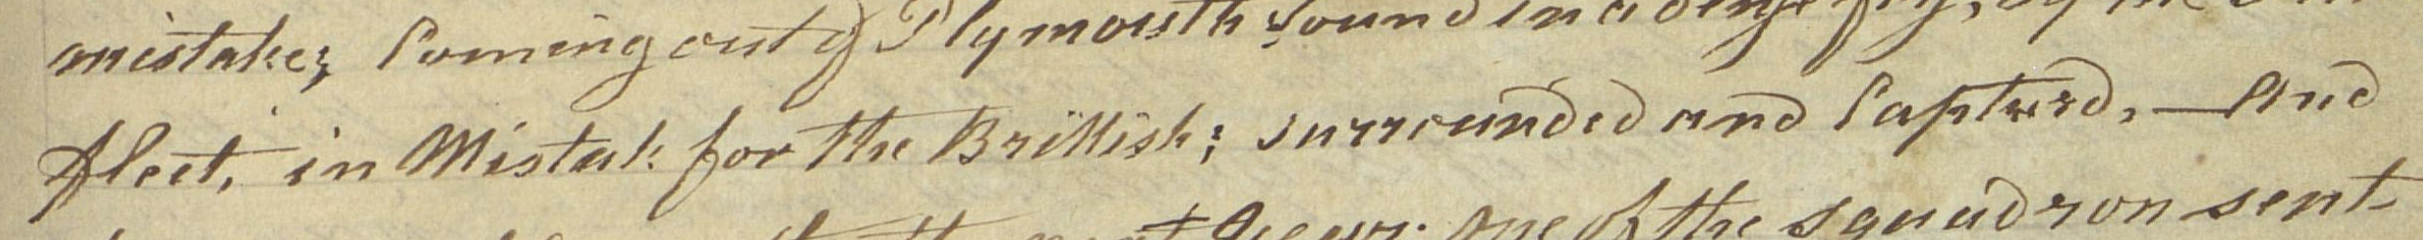fleet, in Mistake for the Brittish; surrounded and Capturd, And
